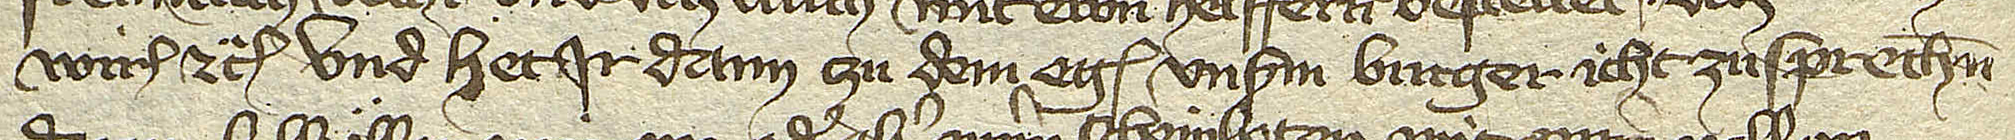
wir ec* vnd het Ir dann cʒu dem eg* vnſ*m burger icht ʒuſprechn*
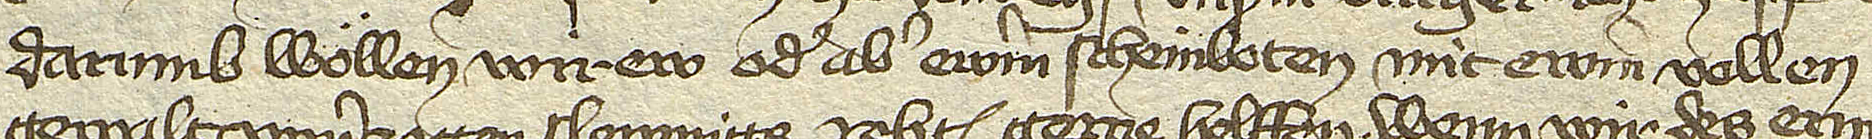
darumb wöllen wir ew od* ab* ewm* ſcheinboten mit ewm* vollen
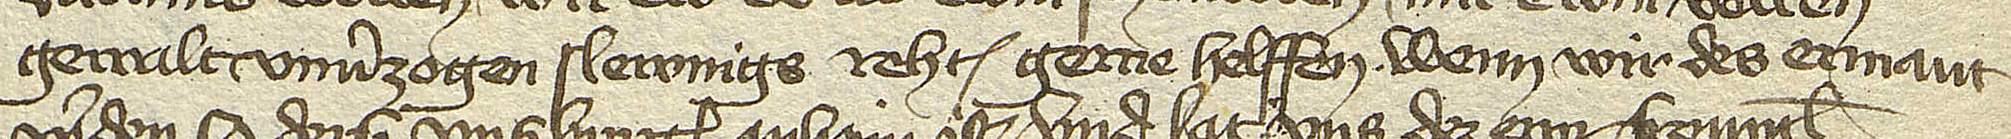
gewalt vnu*ʒogen ſlewnigs reht* gerne helffen . wenn wir des ermant
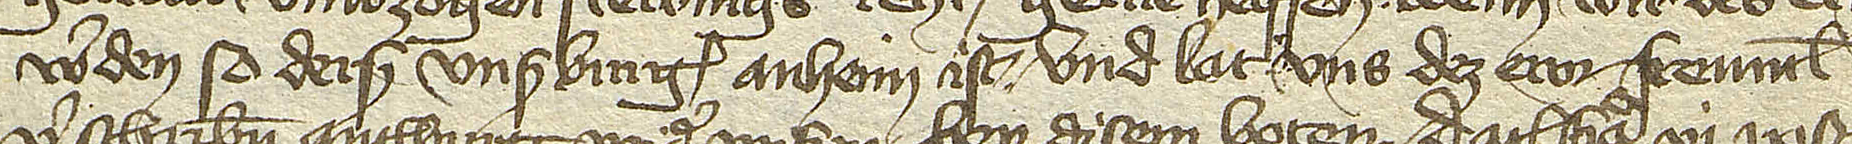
w*den ſo derſ* vnſ* burg* anheim iſt / vnd lat vns deʒ ewr freuntl*
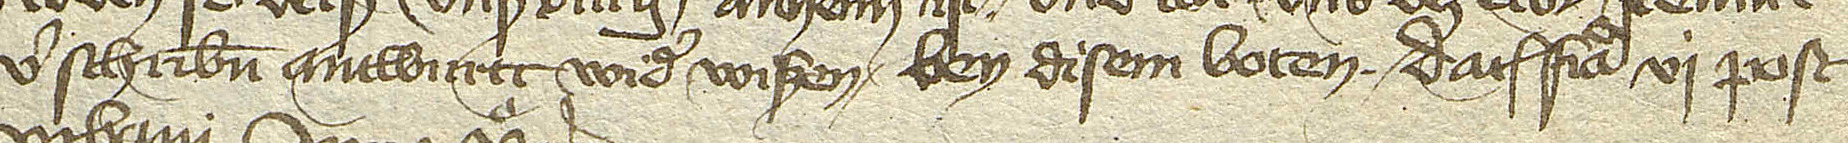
v*ſchribn* antwurtt wid* wiſʒen / bey diſem boten . / dat* fia* vi poſt
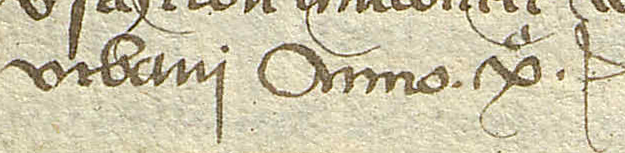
vrbani Anno . x* . §
